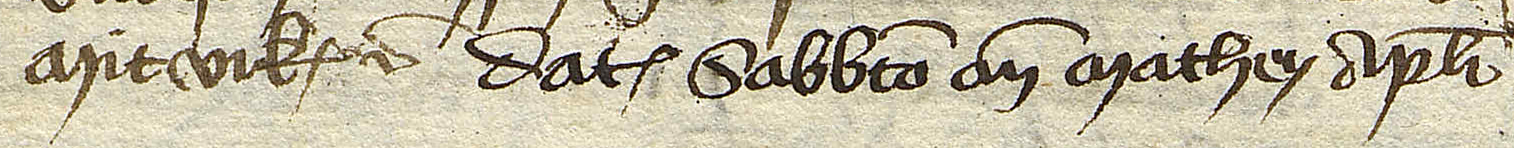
Mit vrk* ec* Dat* Sabbto* an* Mathey Apli*
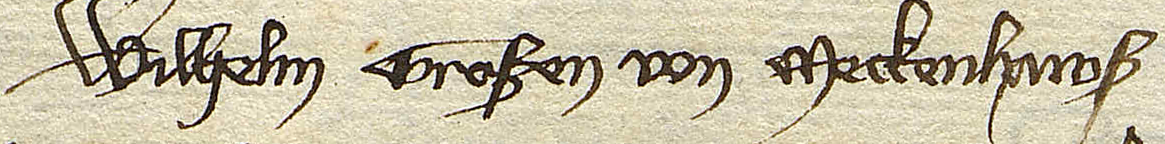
Wilhelm Groſʒen von Meckenhawſ*
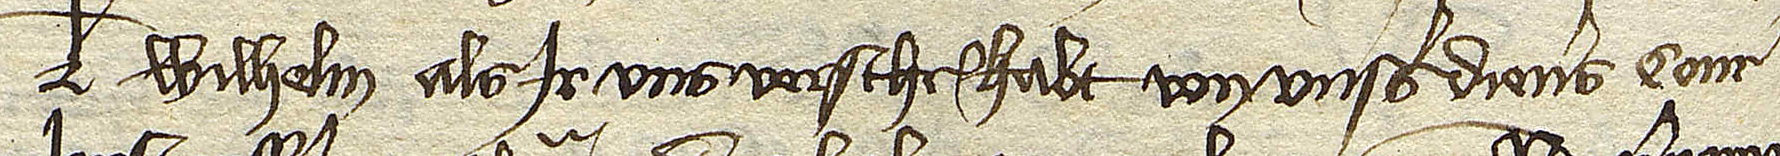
L* Wilhelm als Ir vns verſchr* habt von vnſs* diens* Conr*
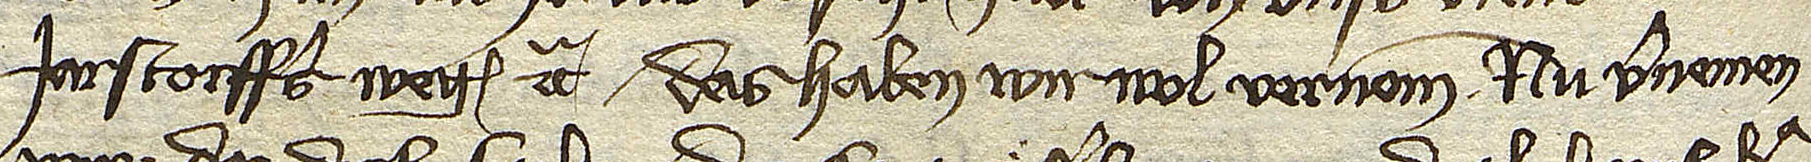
Iarſtorffs* weg* ec* / Das haben wir wol vernom* . Nu vnemen*
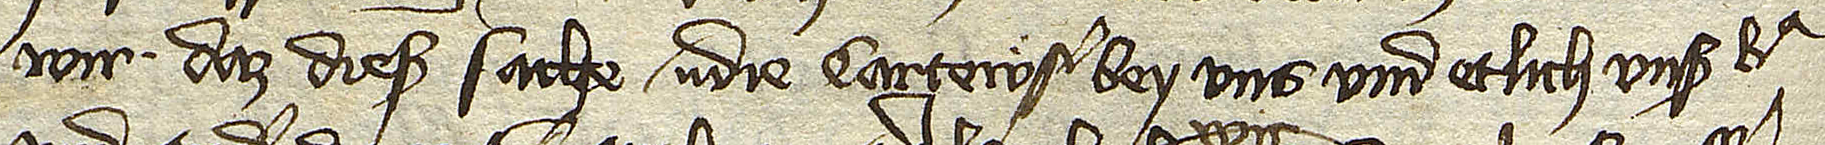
wir . daʒ dieſ* ſache / ~ die Carteẅſ* bey vns vnd etlich vnſ* b*
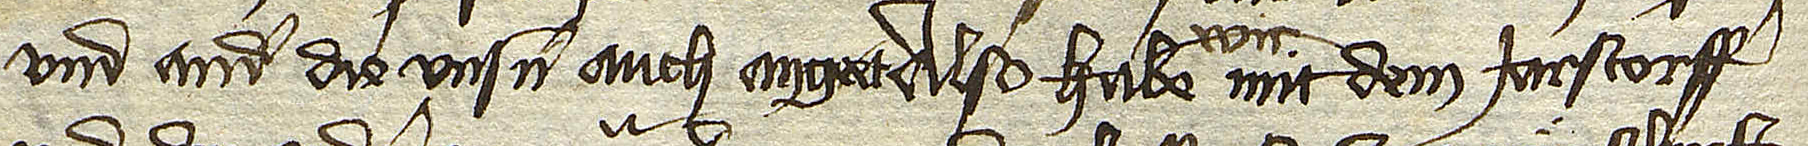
vnd and* die vnſn* auch angeet / Alſo habe* mit dem Iarſtorff*
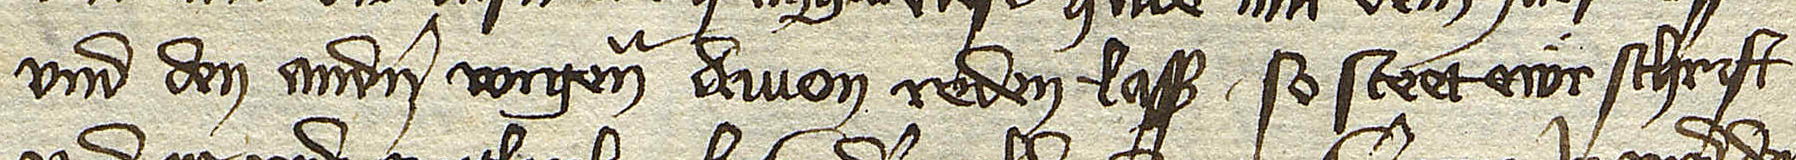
vnd den andn* vorgen* dauon reden laſſ* / ſo ſteet eẅr ſchrift
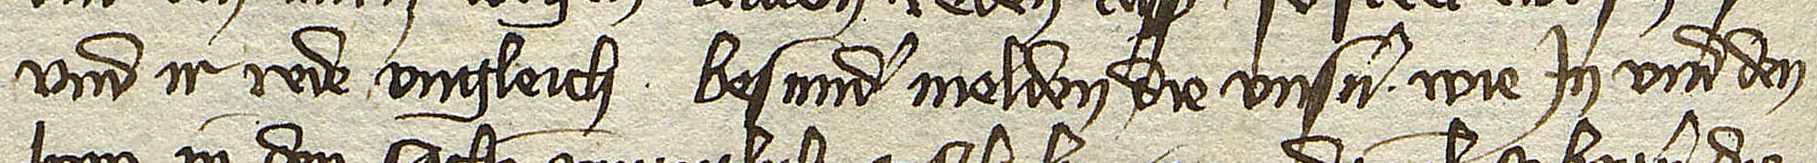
vnd ir rede vngleich . beſund* melden die vnſn* . wie In vnd den
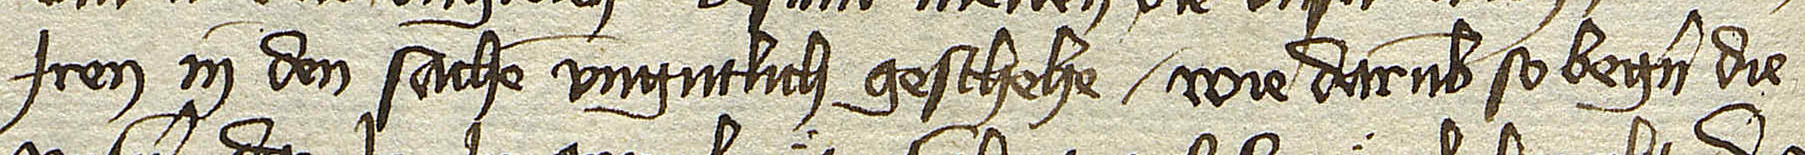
Iren in den ſache* vngutlich geſchehe / wie darub* ſo begn* die
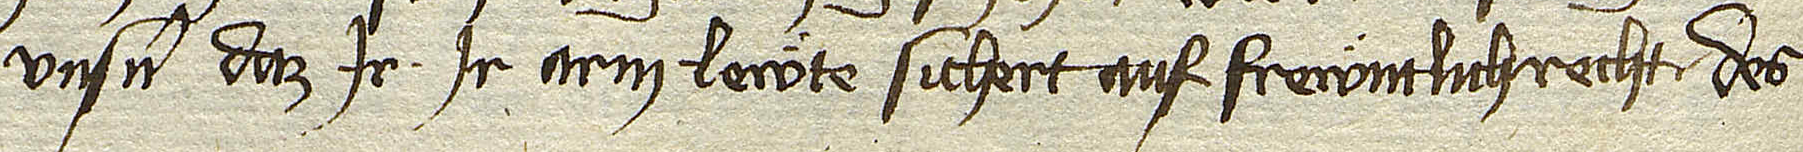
vnſn* daʒ Ir . Ir arm leẅte ſichert auf freẅntlich recht / des
